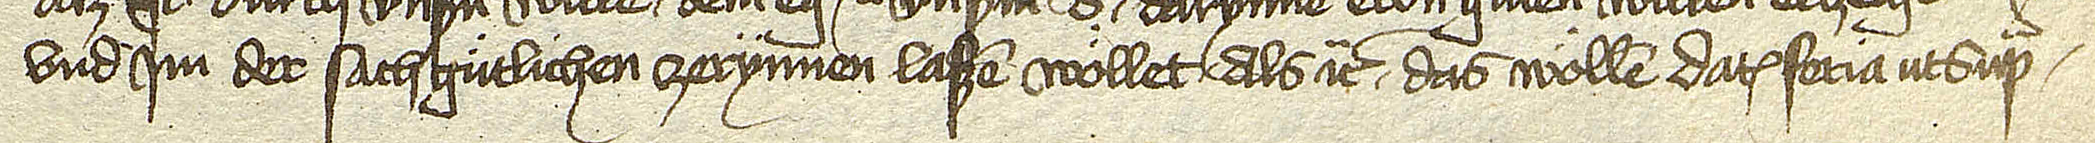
vnd Im der ſach gütlichen cʒerynnen laſʒe* wöllet / Als ec* / das wölle* dat* feria ut Sup* /
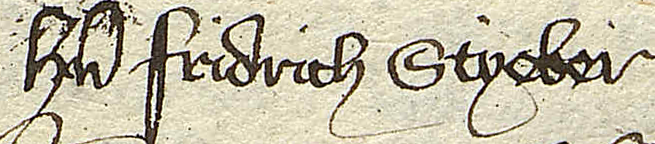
hn* Fridrich Styeber
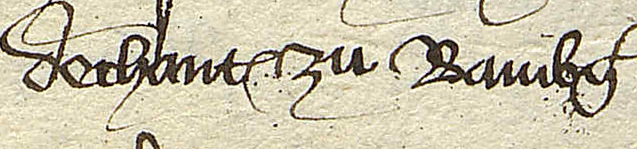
Dechant* cʒu Bambg*
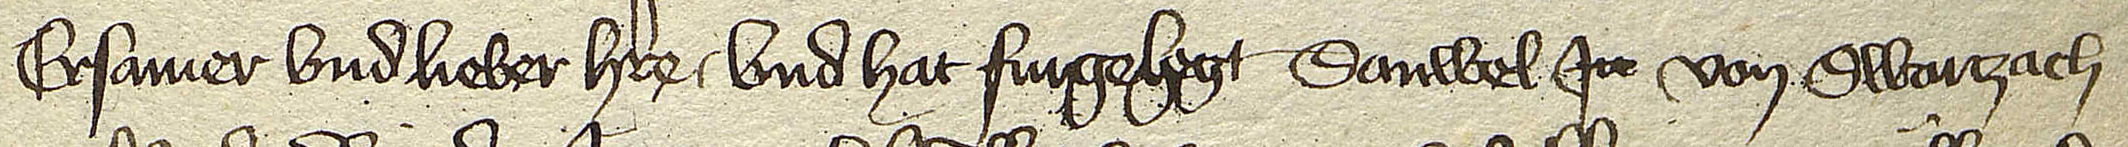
Erſamer vnd lieber h*re / vnd hat furgelegt Sanwel In von Swarcʒach
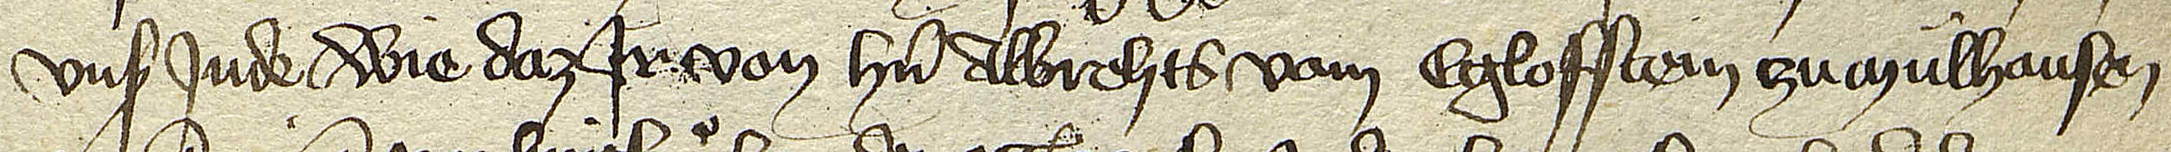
vnſ* Iude / wie daʒ Ir von hn* Albrechts vom Eglofſtein cʒu Mülhauſen
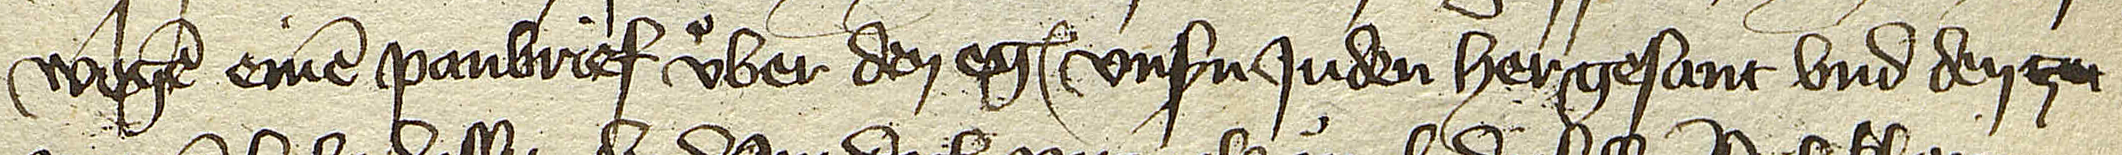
wege* eine* panbrief v̈ber den eg* vnſn* Iuden hergeſant vnd den cʒu
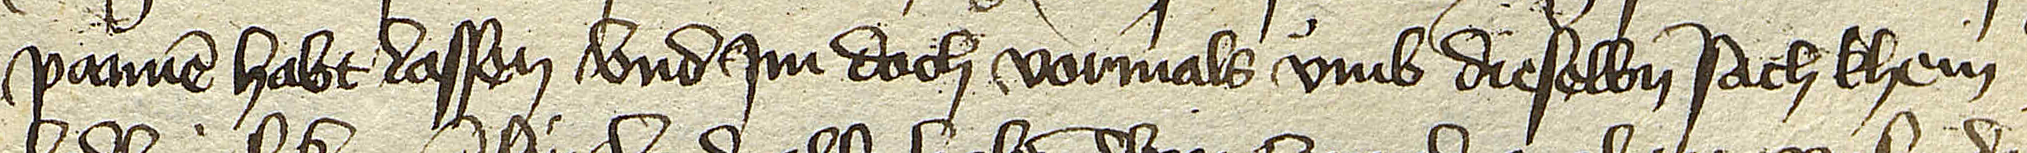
panne* habt laſſen / vnd Im vormals v̈mb dieſelbn* ſach khein
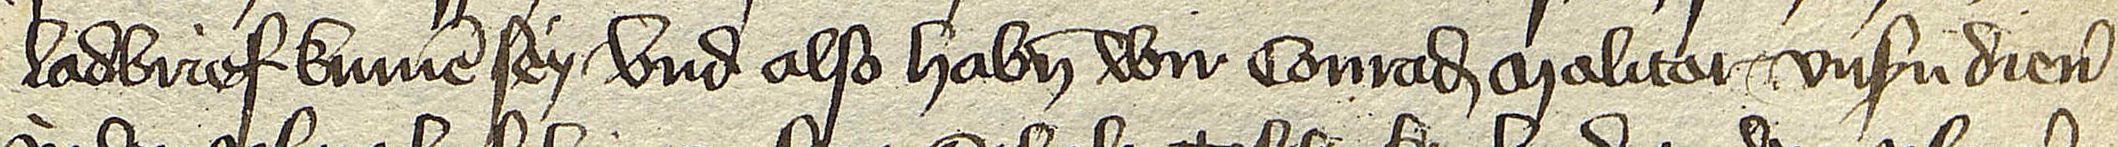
ladbrief kume* ſey / vnd alſo habn* wir Conrad* Molitor vnſ*n dien*
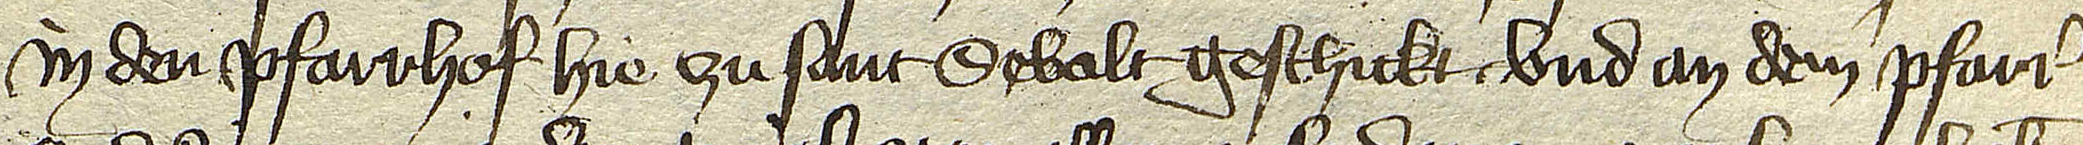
in den pfarrhof hie cʒu ſant Sebolt geſchickt / vnd an dem pfarr*
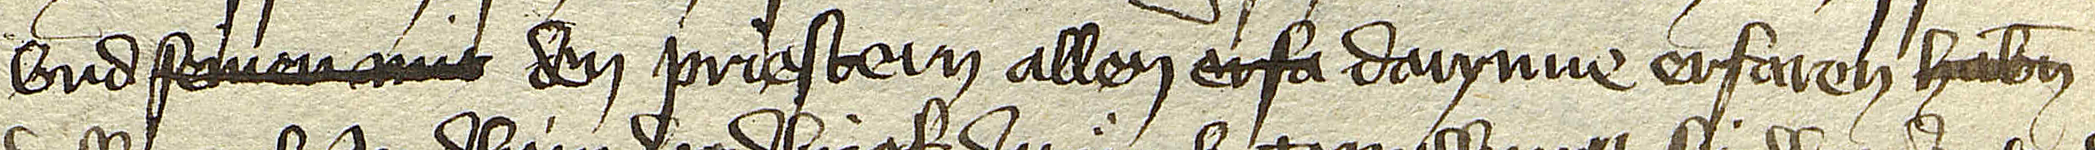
vnd ſeinen mit den prieſtern allen erfa darynne erfaren habn*
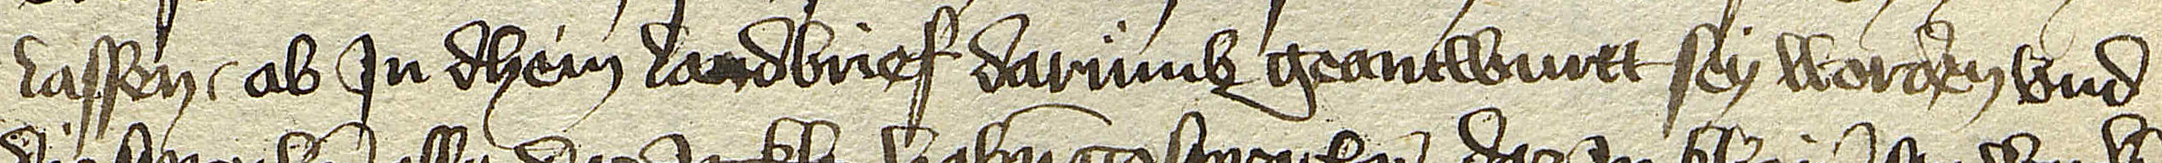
laſſen / ab In dhein landbrief darümb geantwurtt ſey worden vnd
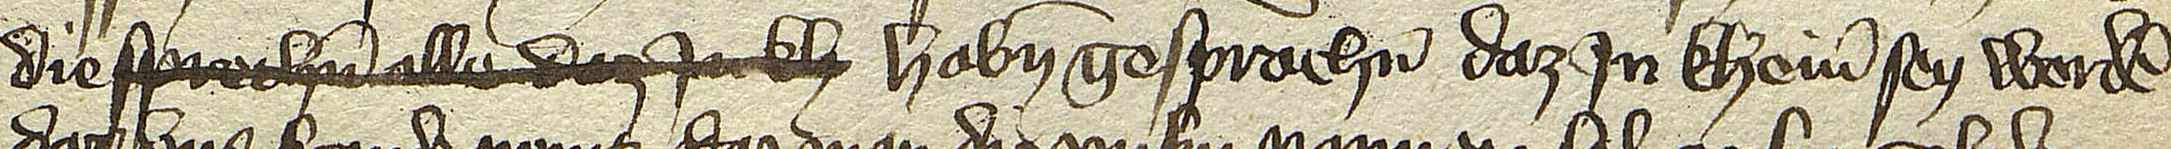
die ſprechn* alle daʒ in kh habn* geſprochn* daʒ In khein* ſey word*
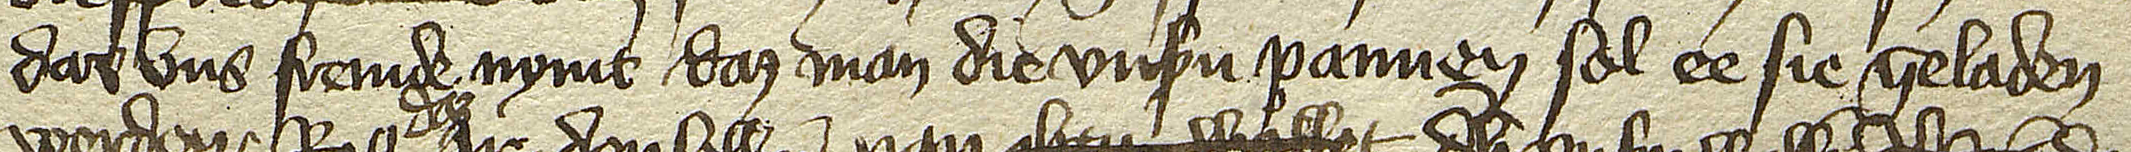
das vns fremde nymt / daʒ man die vnſ*n pannen ſol ee ſie geladen
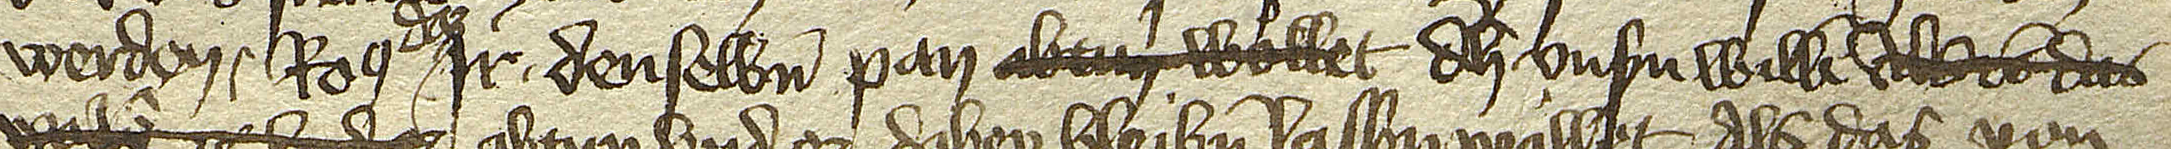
werden / Ro* / Ir denſelbn* pan abtun wöllet d*h vnſ*n wille* Als ec* das
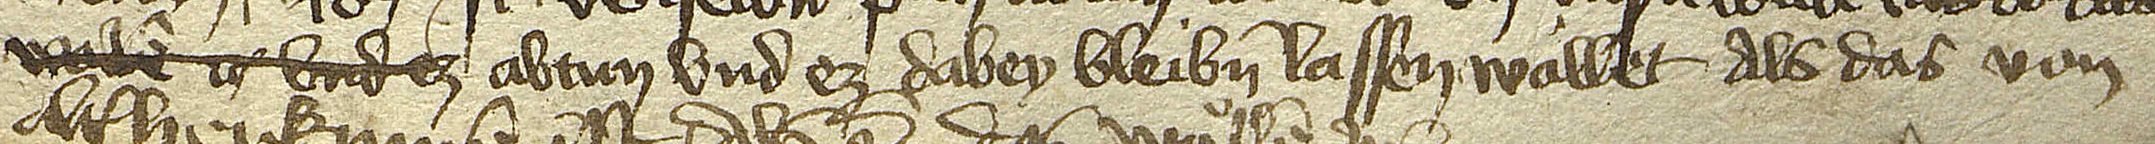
wölle* ec* vnd eʒ abtun vnd eʒ dabey bleibn* laſſen wöllet Als das von
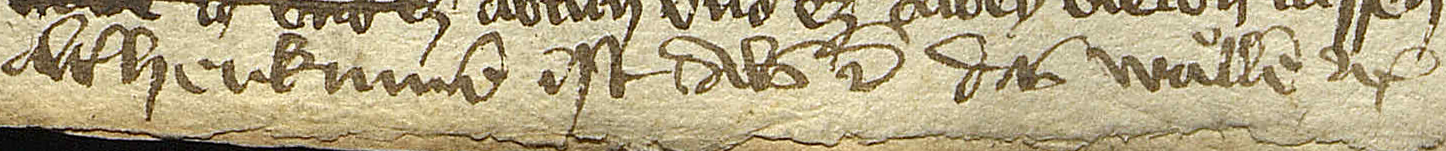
alt* herkume* iſt / Als ec* das wölle* ec*
